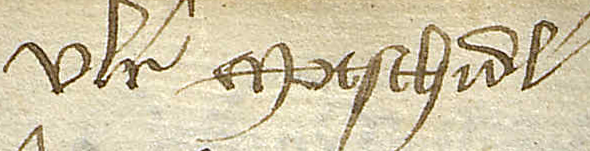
vlr* Motſchidl*
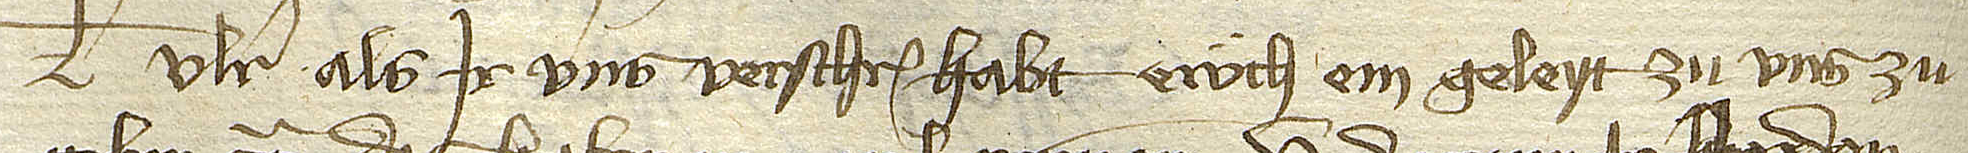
L* vlr* . als Ir vns verſchr* habt ewch ein geleyt ʒu vns ʒu
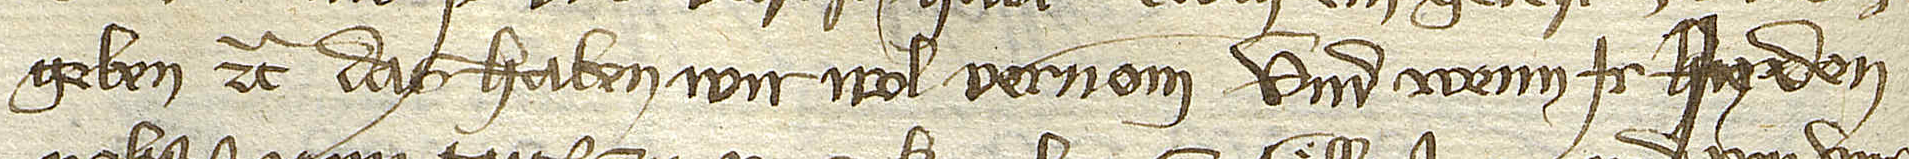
geben ec* das haben wir wol vernom* Vnd wenn Ir In den
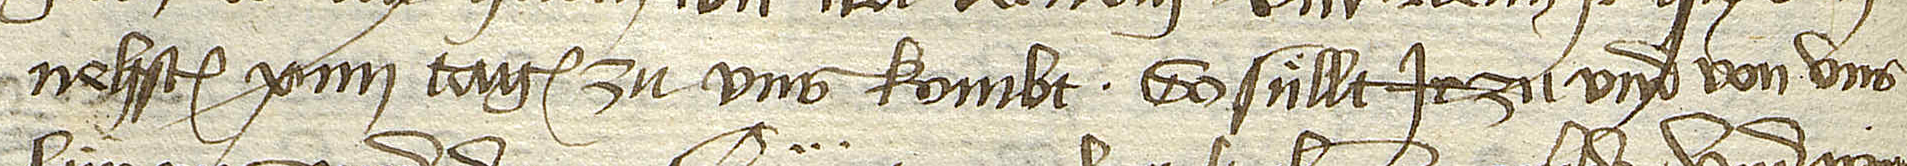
nehſt* xiiii tag* ʒu vns kombt . So ſüllt Ir ʒu vnd von vns
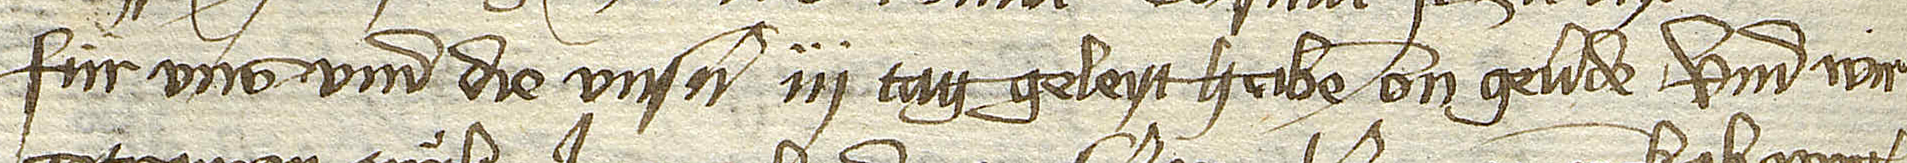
für vns vnd die vnſ*n iii tag geleyt habe* on geu*de / Vnd wir
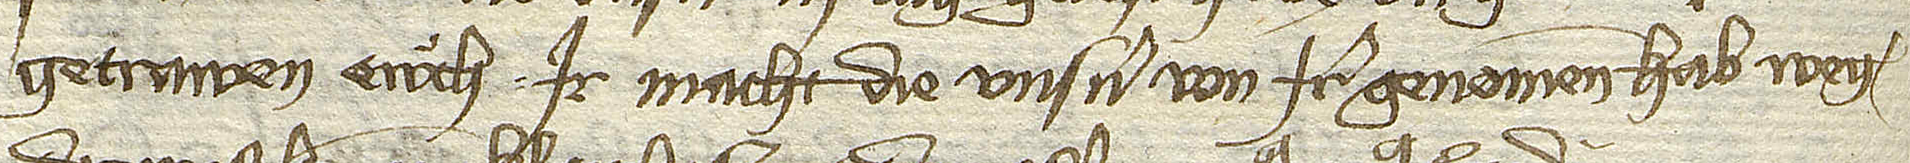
getrawen ewch . Ir macht die vnſ*n von Ir* genomen* hab weg*
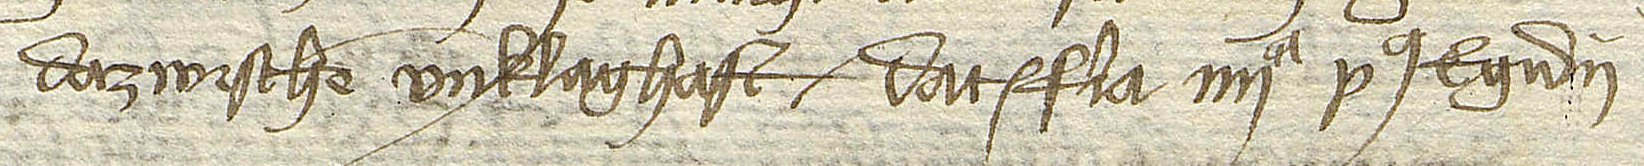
daʒwiſche* vnklaghaft / Dat* fia* iiii* p* Egidii
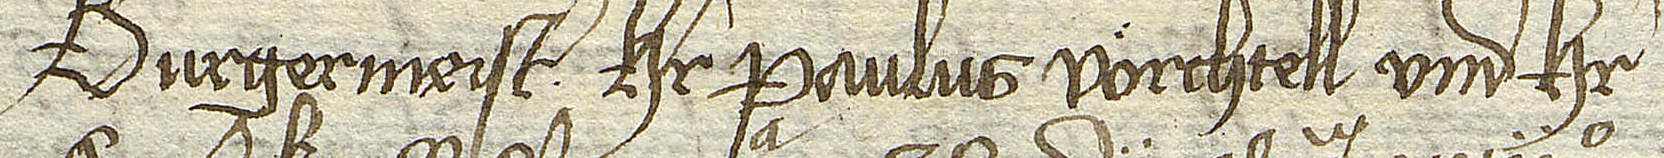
Burgermeiſt* . H*r Paulus Vörchtell vnd H*r
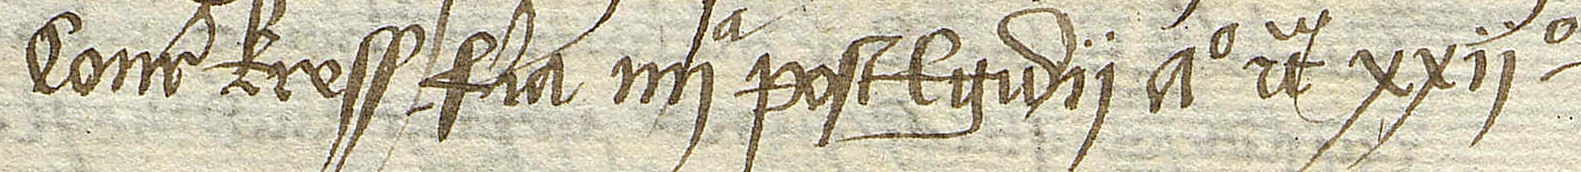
Conr* Kreſſ . fia* iiii* Poſt Egidii a* ec* xxii*
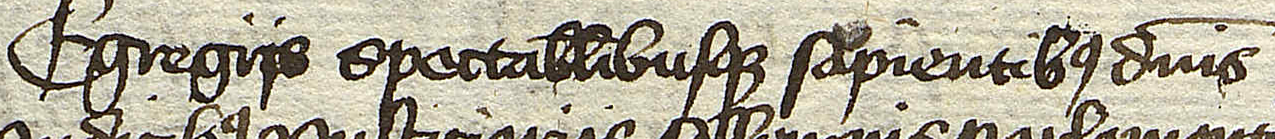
Egregiis Spectab*libuſq* ſapientib* d*nis
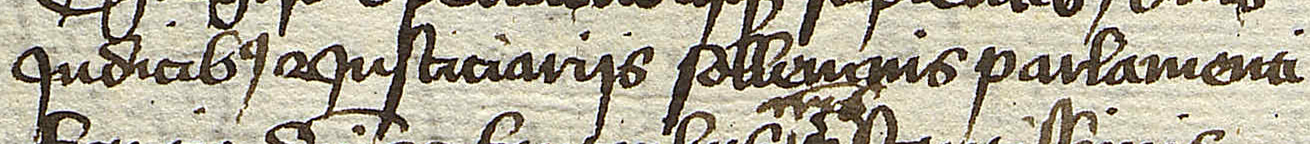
Iudicib* @ Iuſticiariis ſollemnis parlamenti
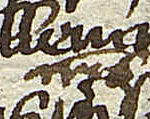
n*r*s
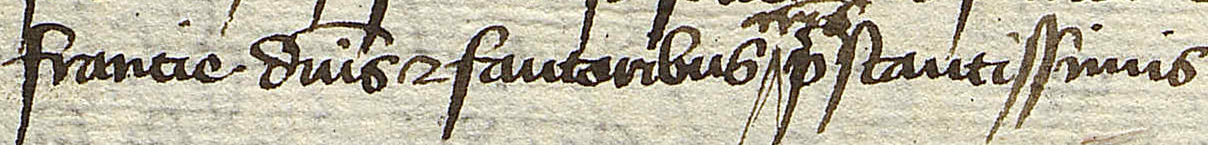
Francie d*nis @ fautoribus p*ſtantiſſimis
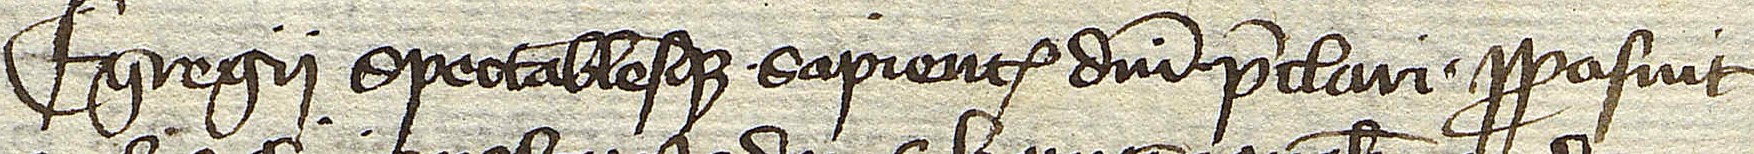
Egregii Spectab*lesq* . d*ni p*clari p*poſuit
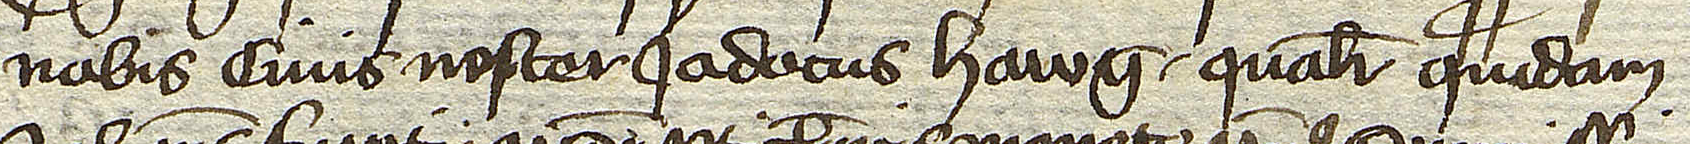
nobis Ciuis noſter Iodocus Hawg / qual*r quidam
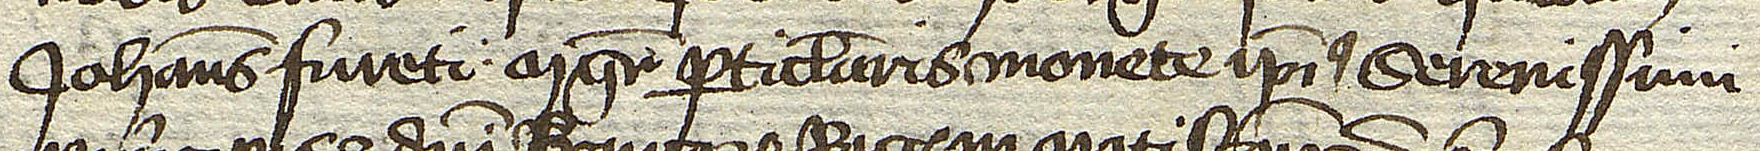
Iohan*s fureti M*g*r P*tic*laris monete ip*i* Sereniſſimi
